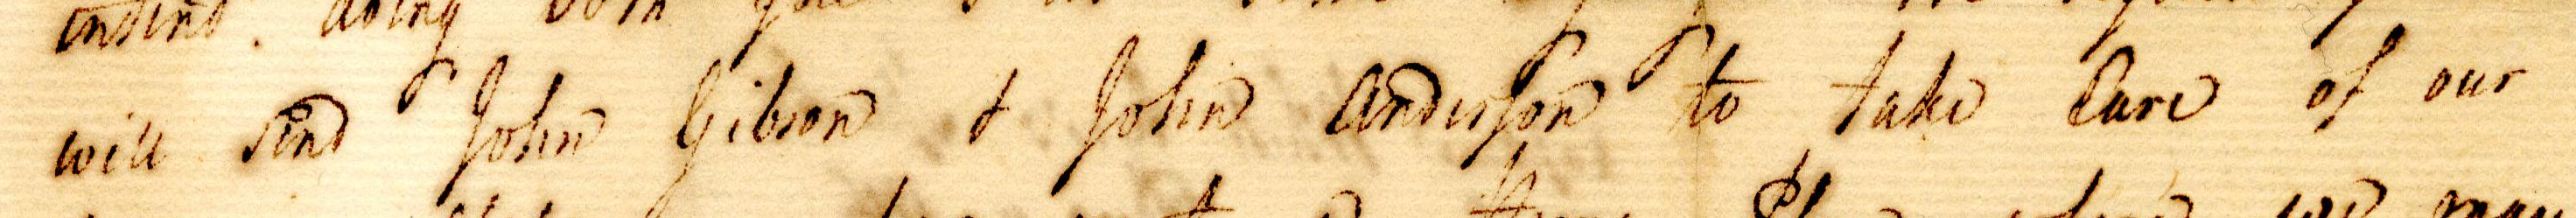will send John Gibson & John Anderson to take Care of our
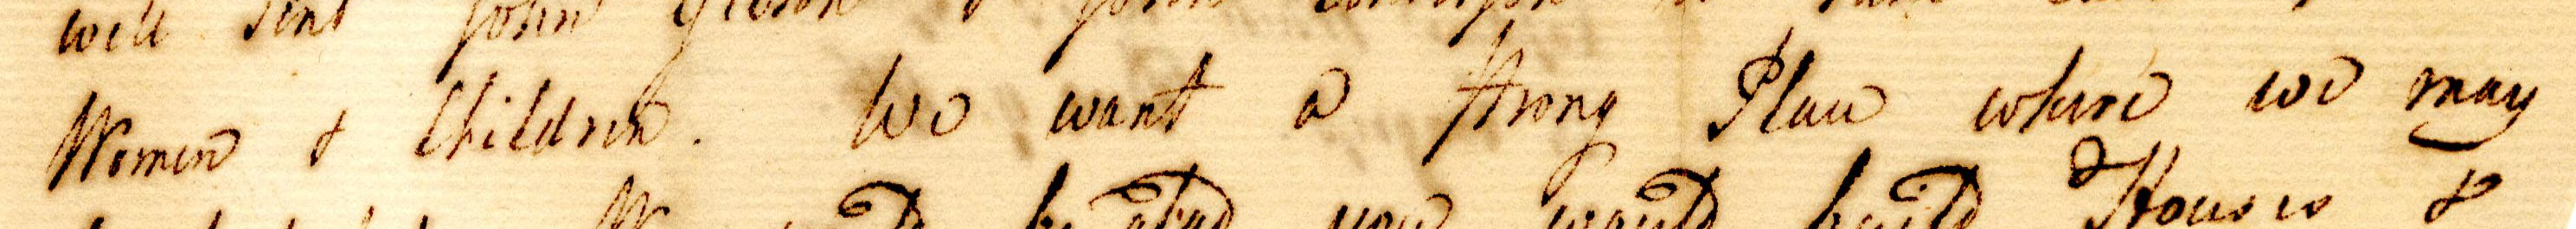Women & Children. We want a strong Place where we may
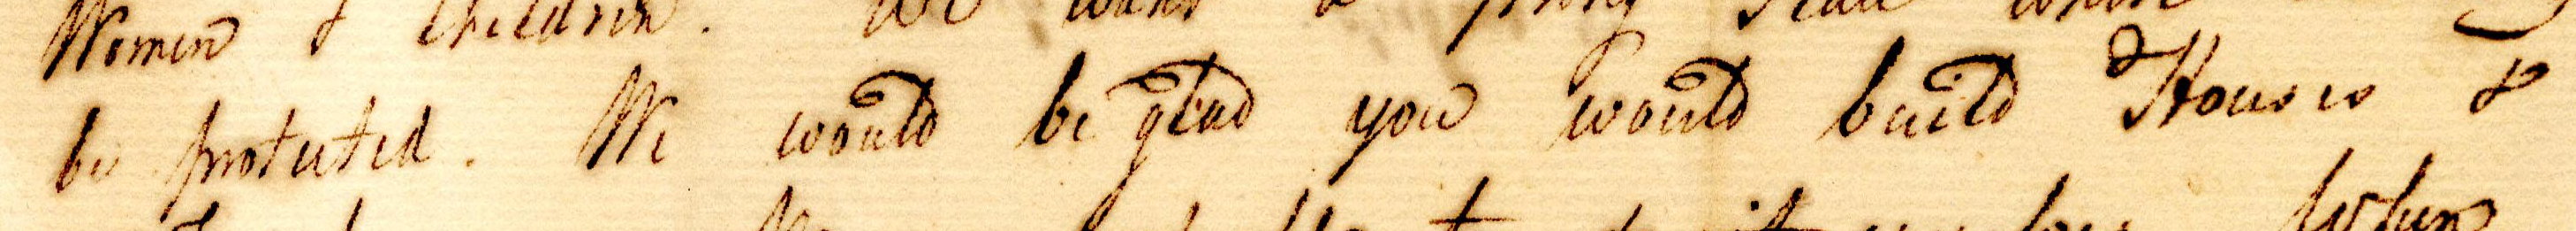be protected. We would be glad you would build Houses &
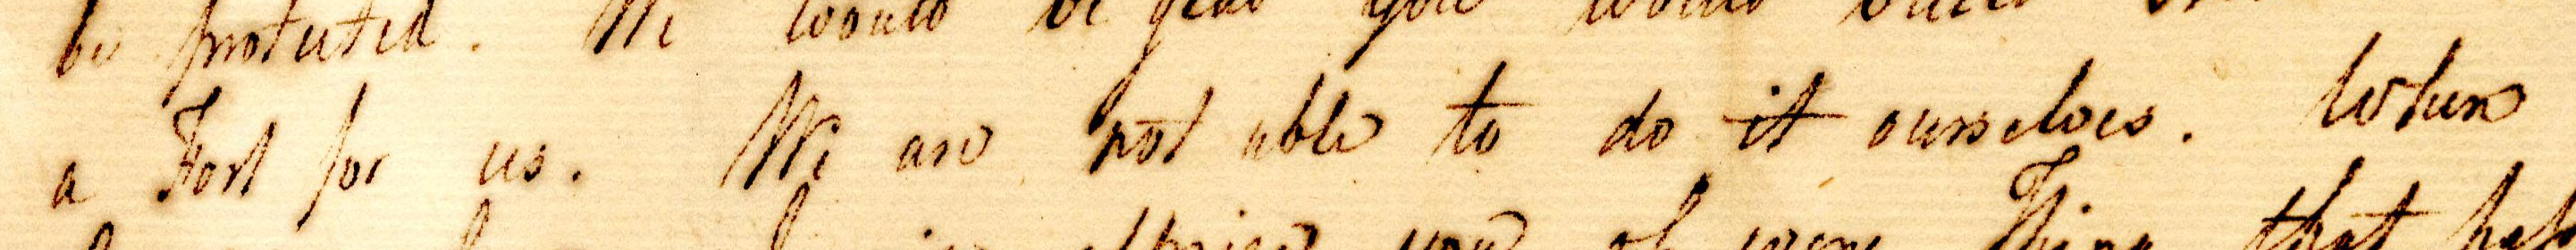a Fort for us. We are not able to do it ourselves. When
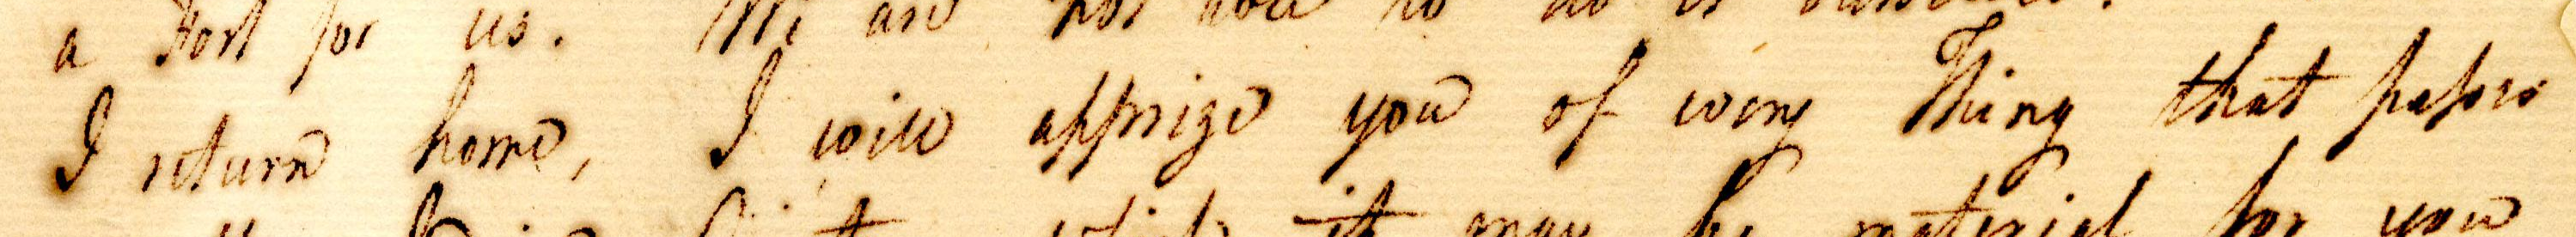I return home, I will apprize you of every Thing that passes
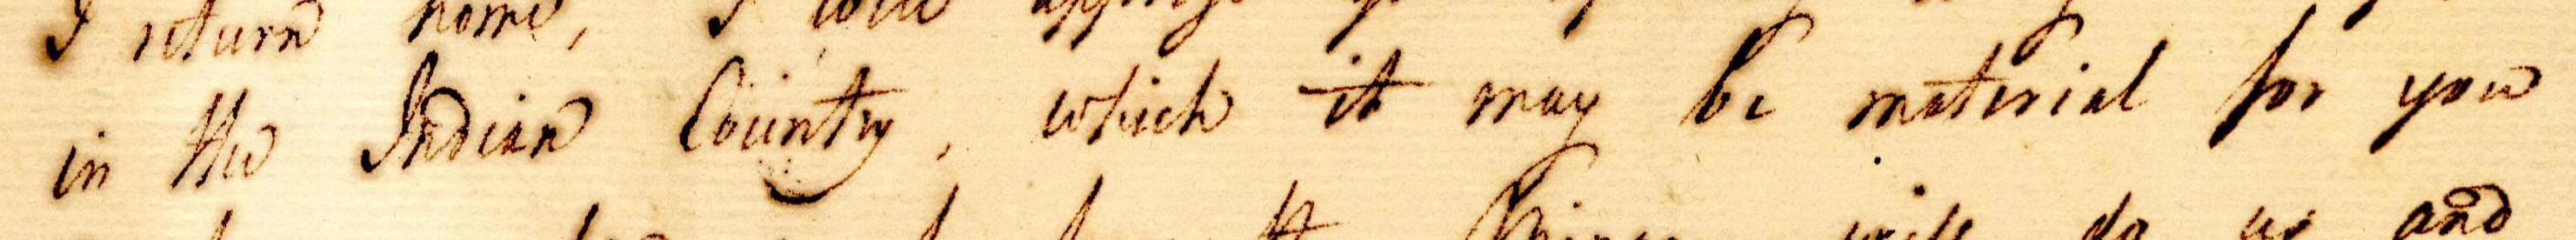in the Indian Country, which it may be material for you
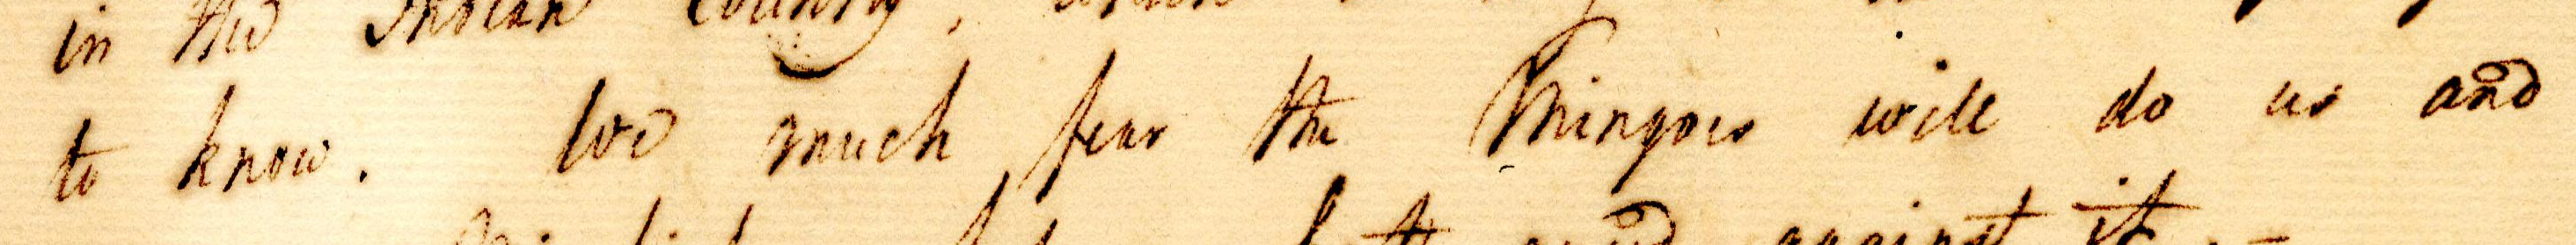to know. We much fear the Mingoes will do us and
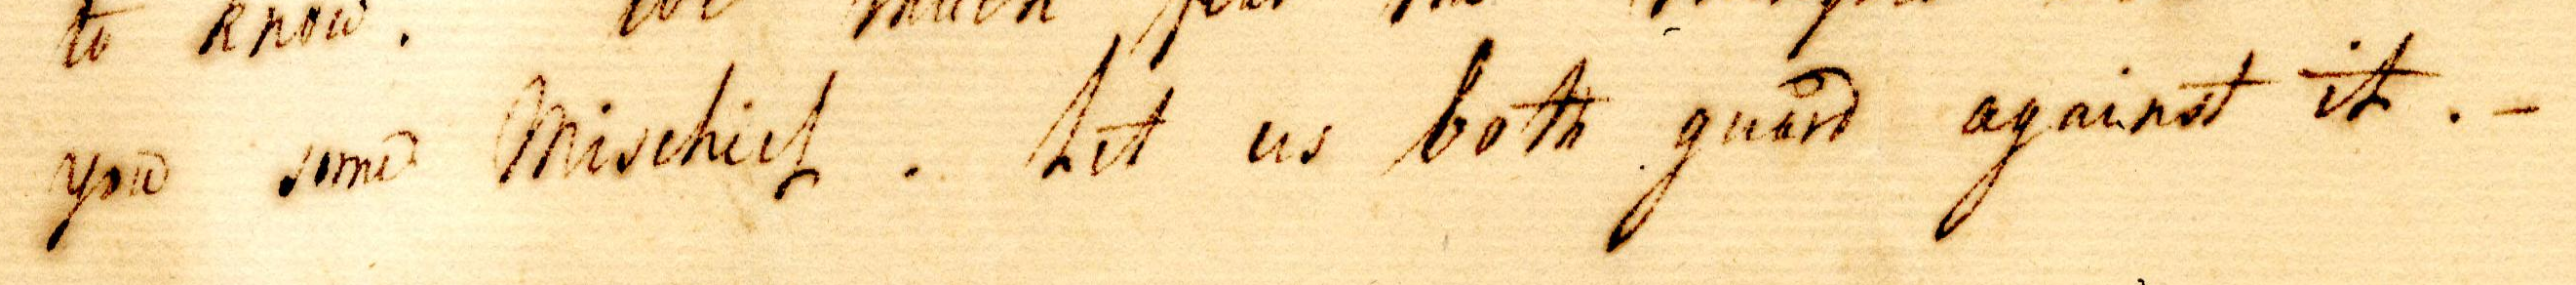you some Mischief. Let us both guard against it.-
